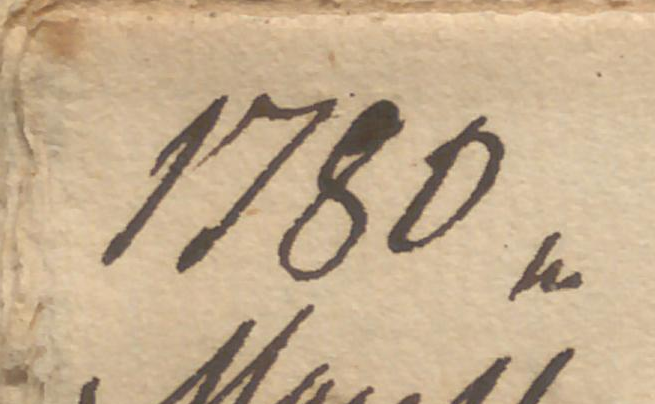1780
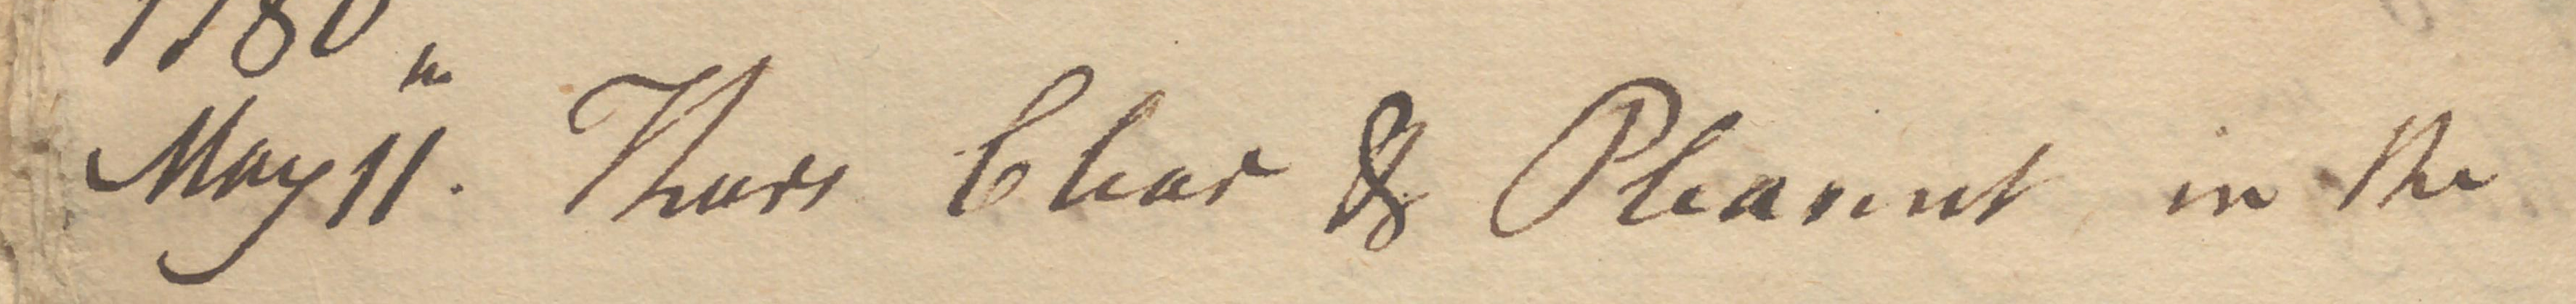May 11^th. Thurs Clear & Pleasent in the
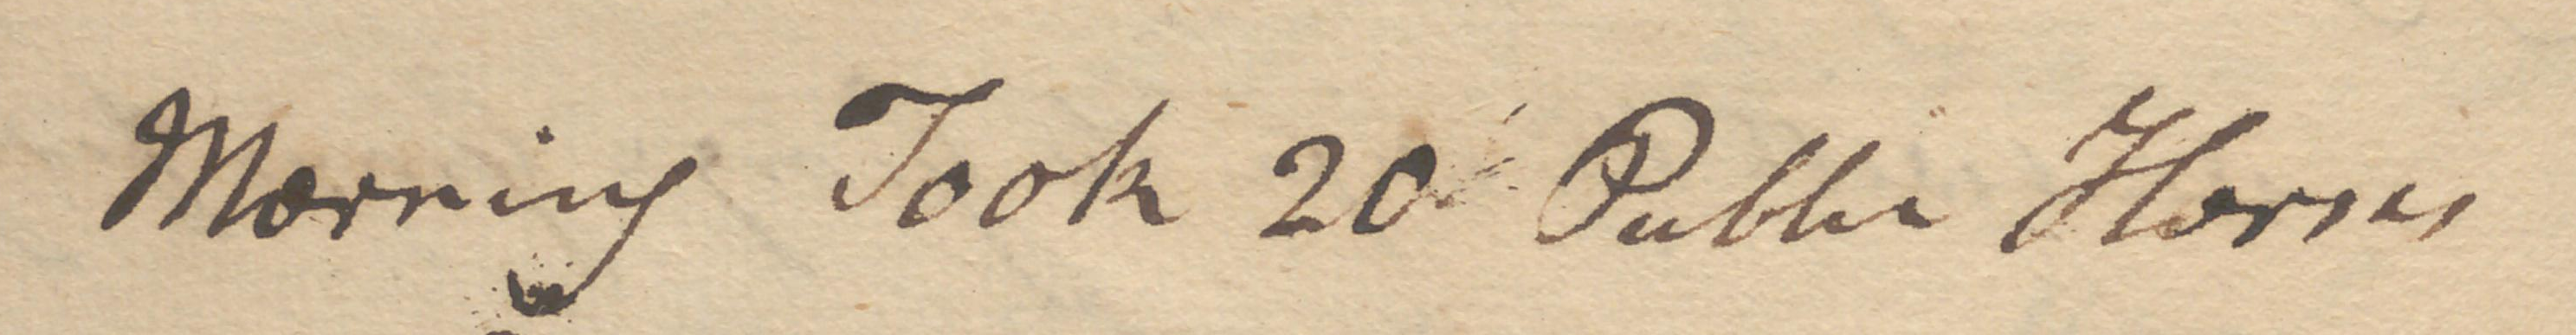Morning Took 20 Public Horses
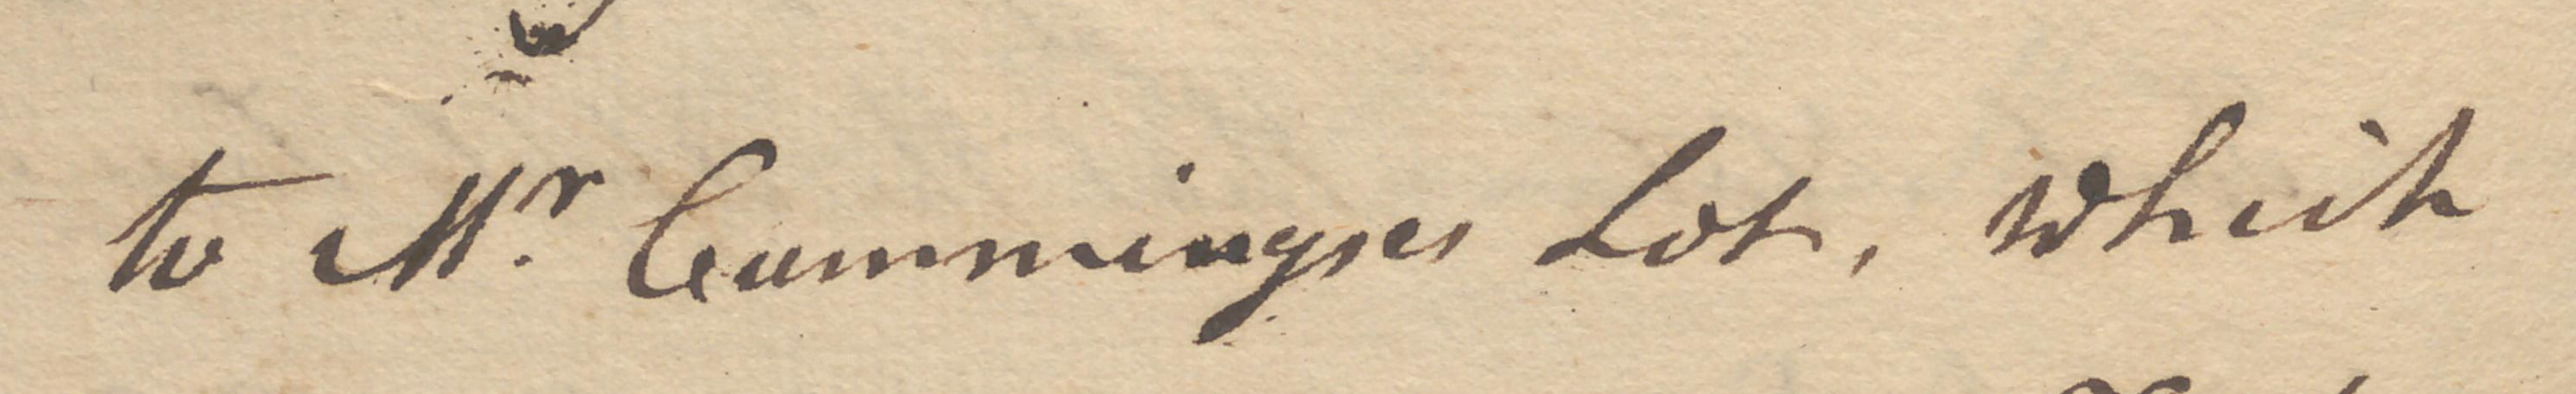to M^r. Cummingses Lot, which
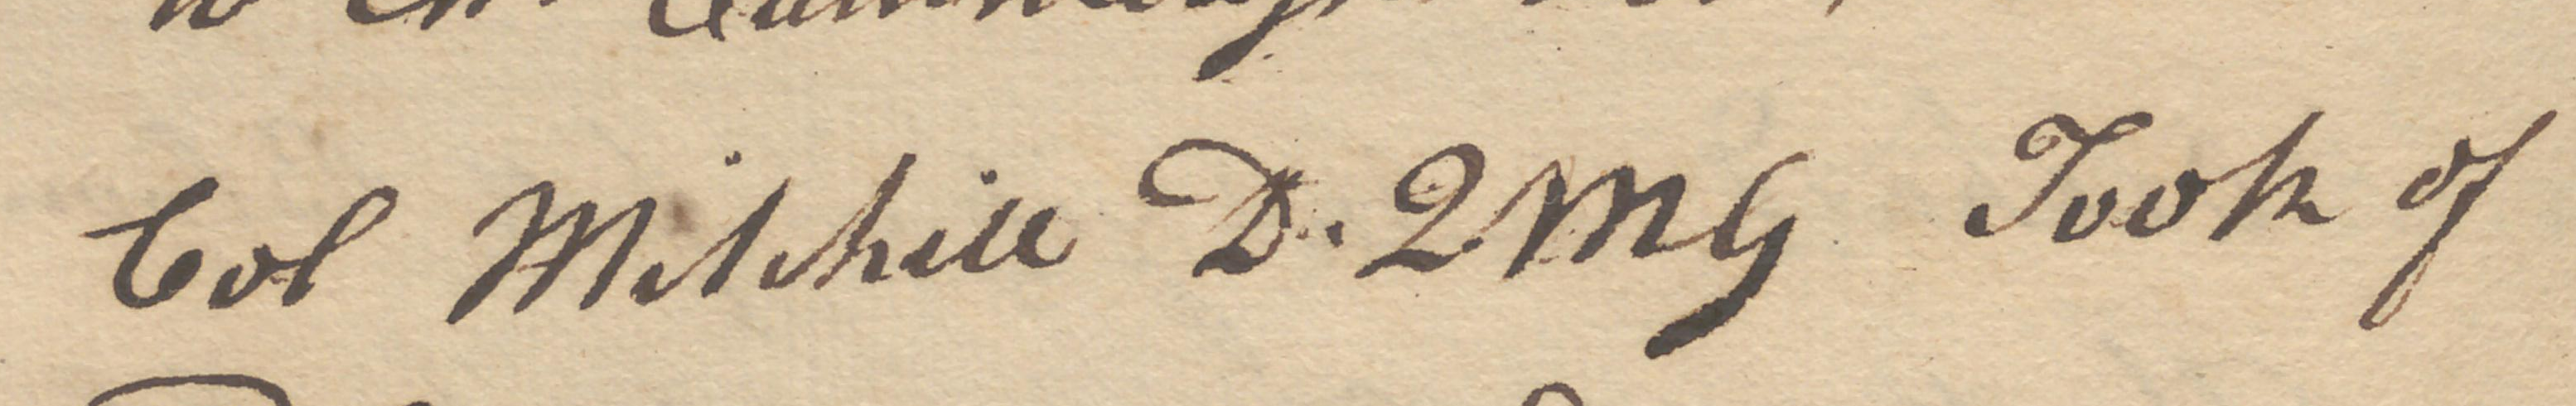Col Mitchill D. QMG Took of
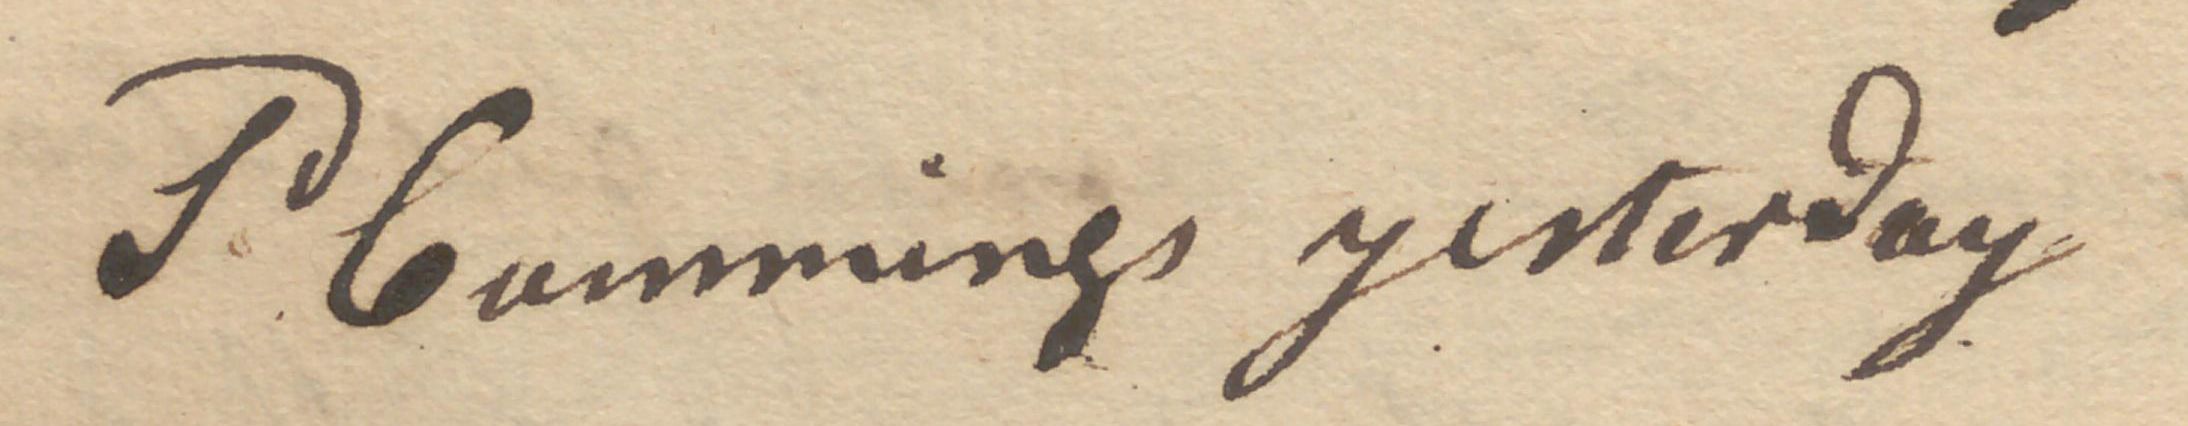S^d. Cummings yesterday
